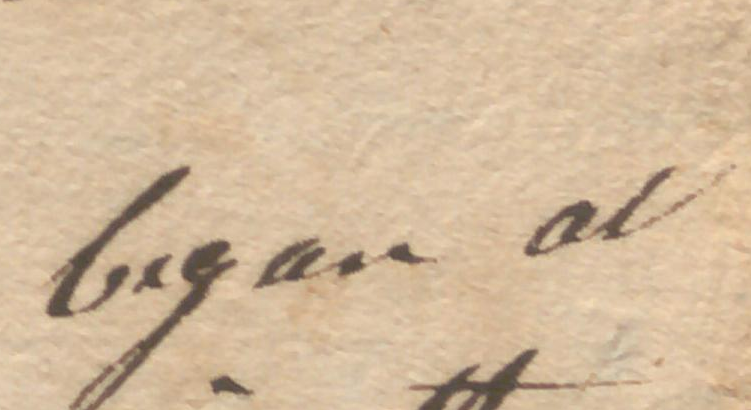began at
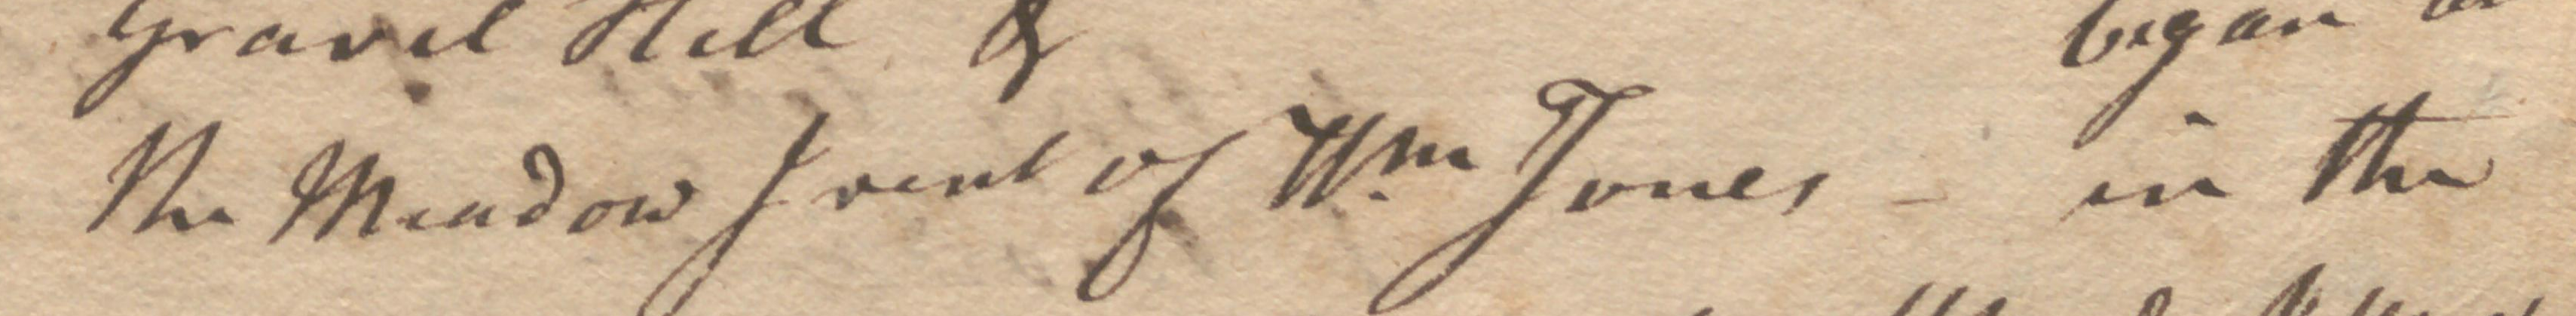the Meadow I rent of W^m Jones- in the
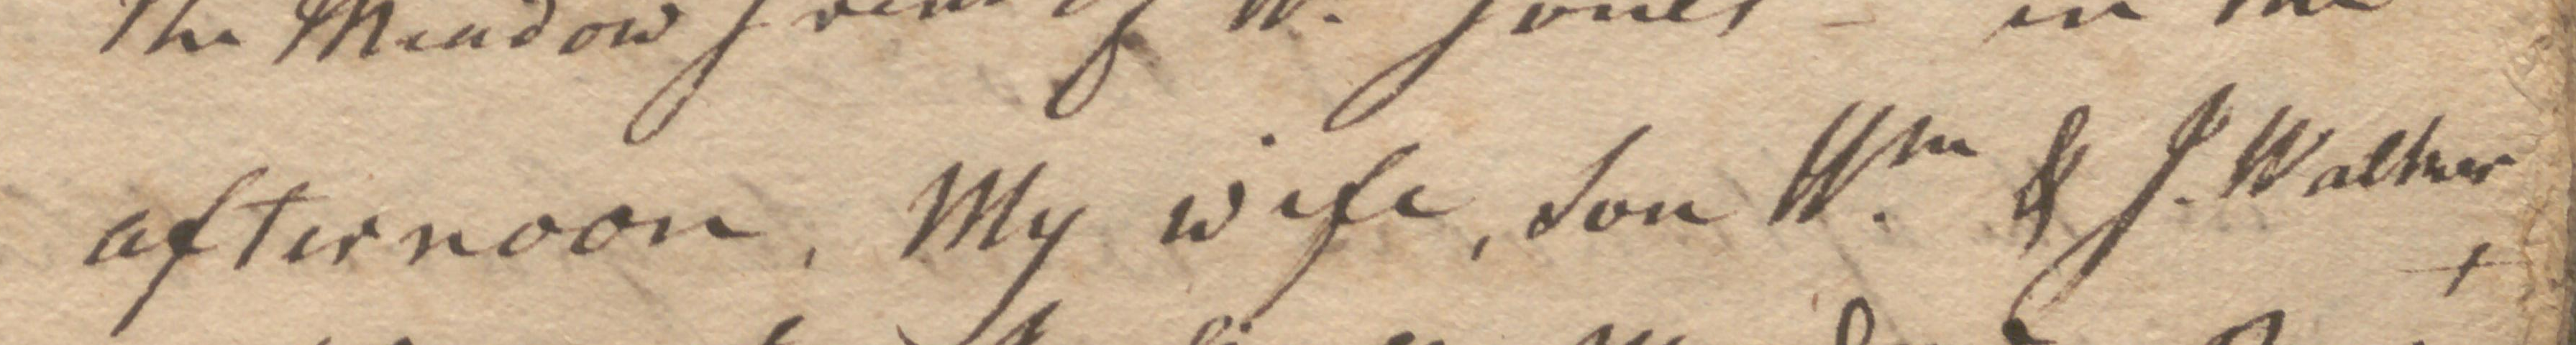afternoon. My wife, Son W^m. & J. Walker
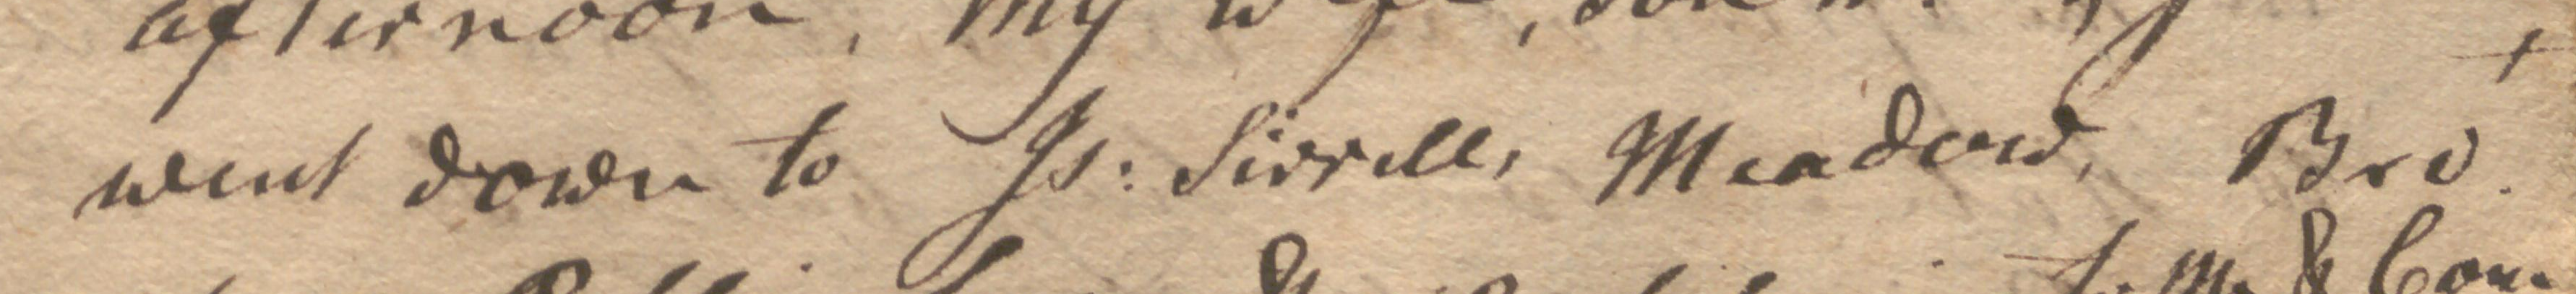went down to Js. Sirrells Meadow, Bro^t.
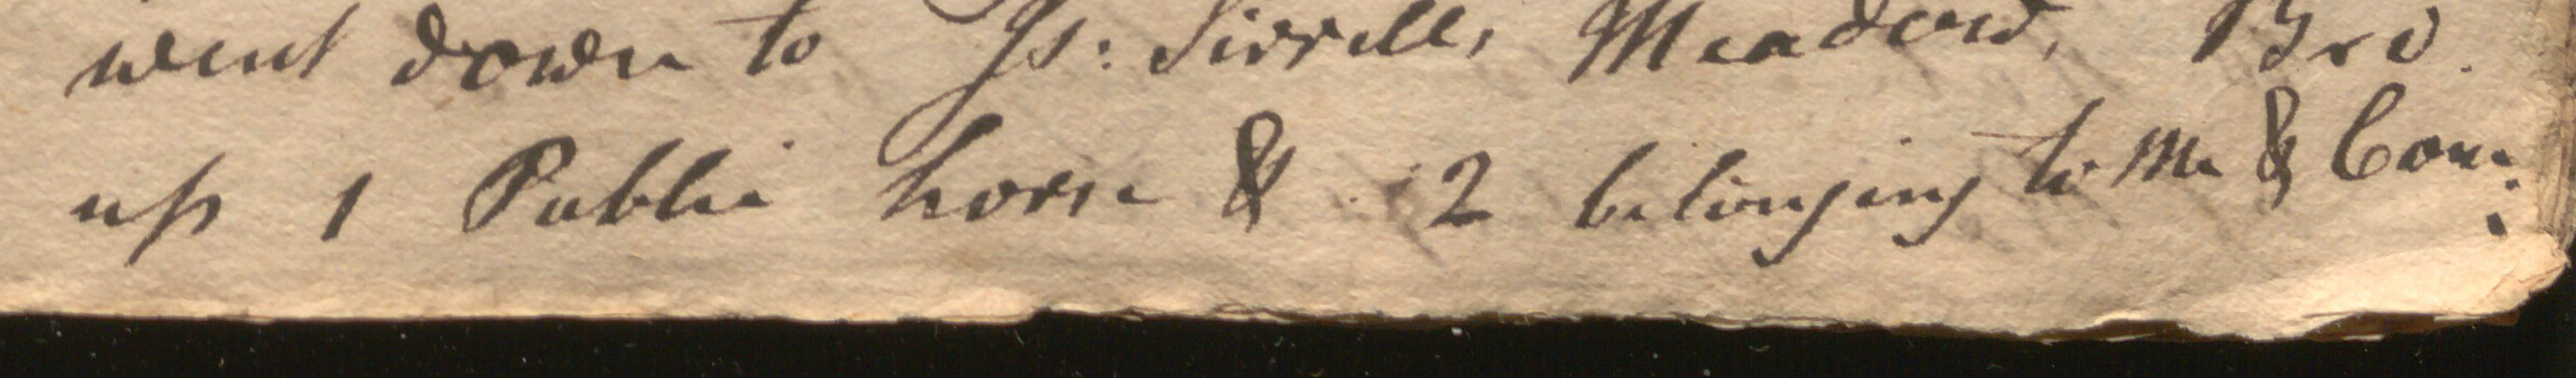up 1 Public horse & 2 belonging ho me & Con.
